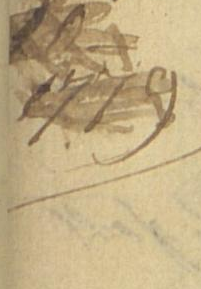1779
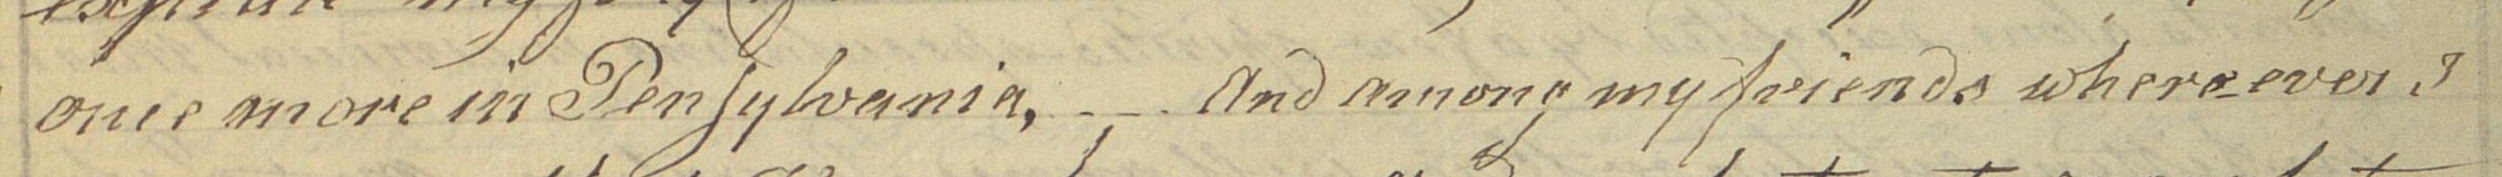once more in Pensylvania, And among my friends whereever I
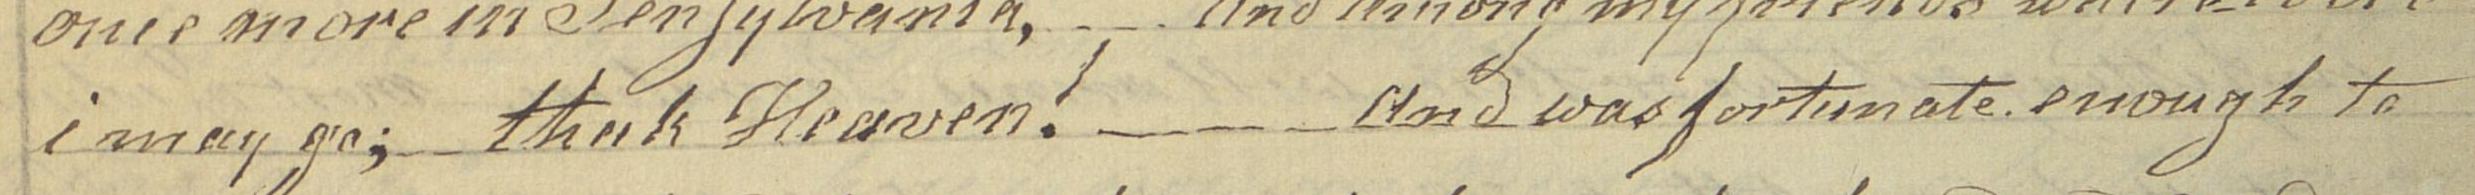i may go; thank Heaven! And was fortunate enough to
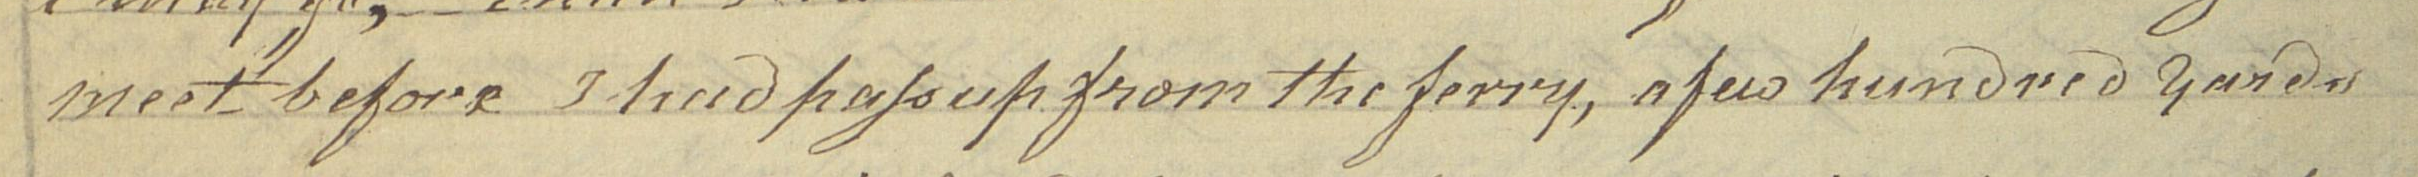meet before I had pass up from the ferry, a few hundred Yards
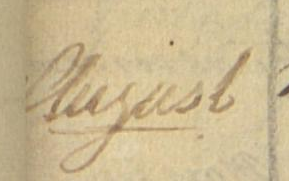August
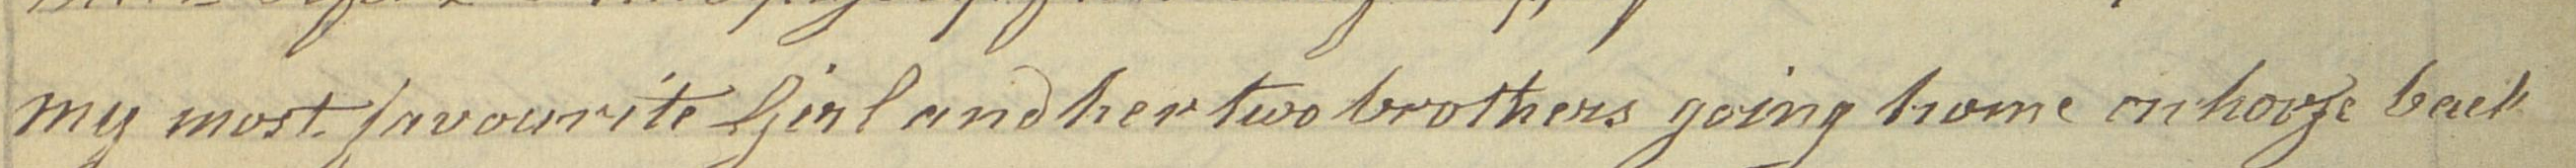my most favourite Girl and her two brothers going home on house back
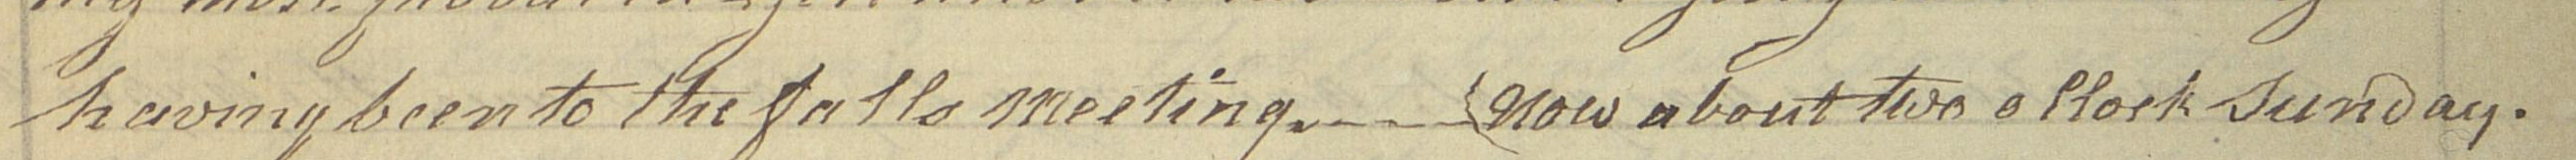having been to the falls meeting. (Now about two o Clock Sunday.
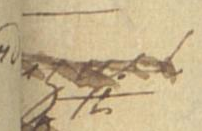ugust
